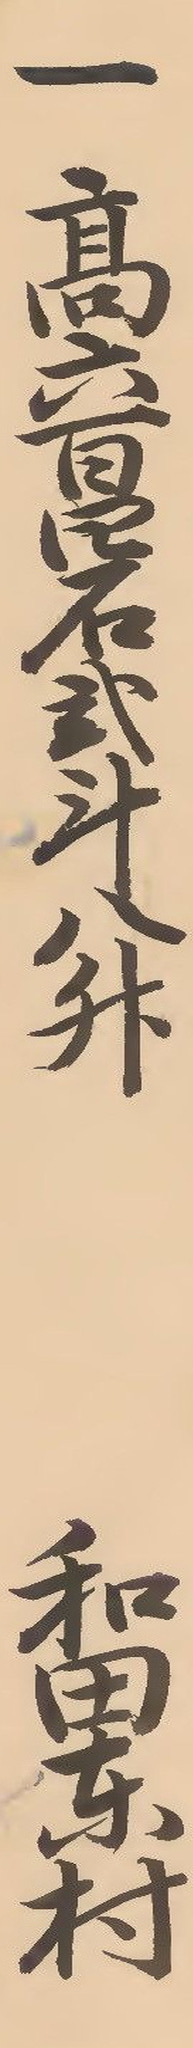一高六百四石弐斗八升和田東村

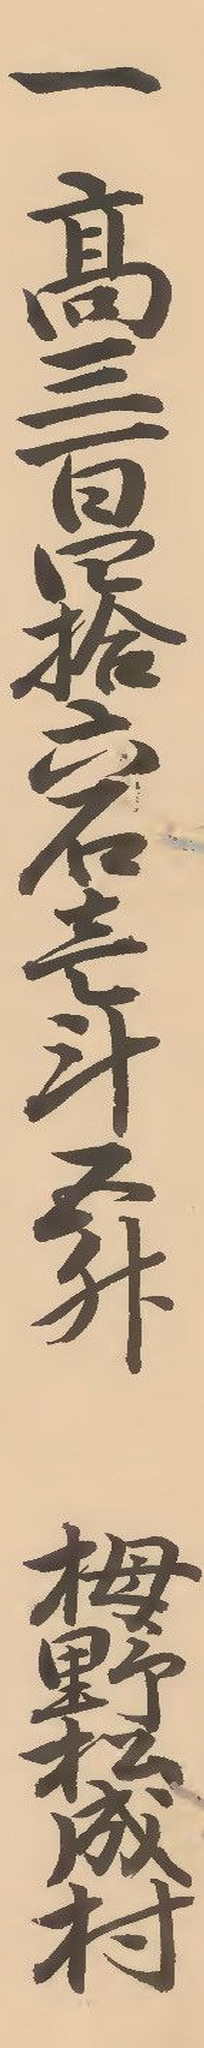一高三百四拾六石壱斗五升栂野松成村
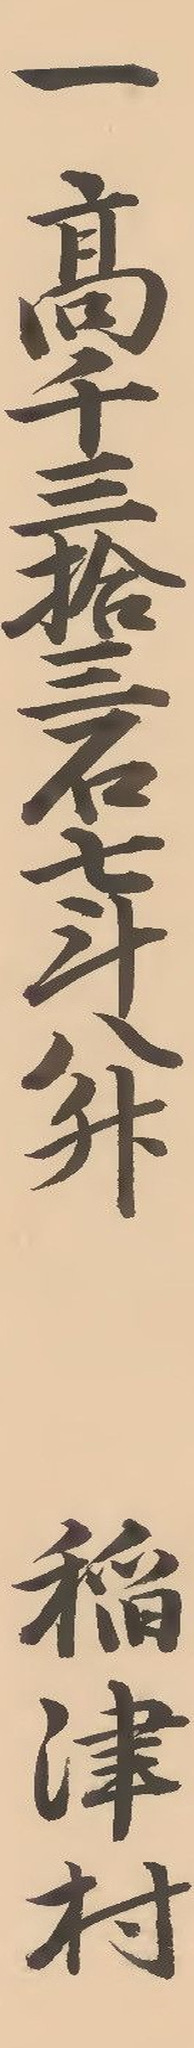一高千三拾三石七斗八升稲津村
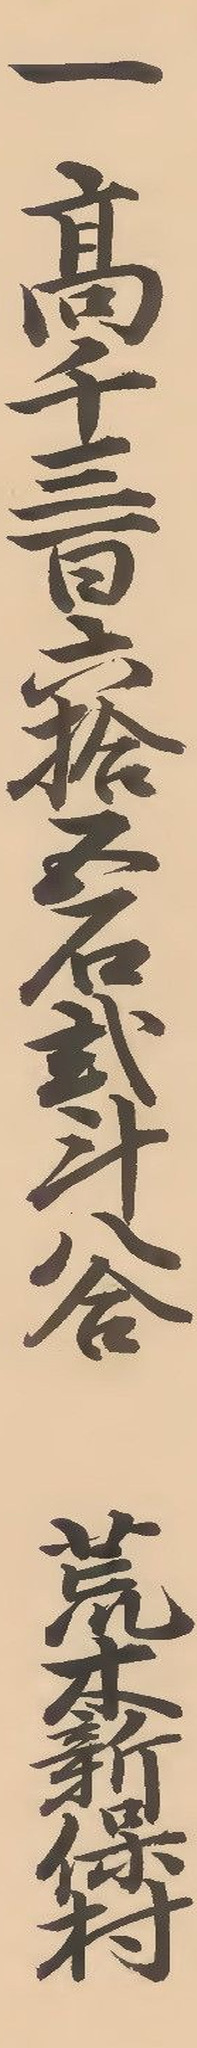一高千三百六拾五石弐斗八合荒木新保村
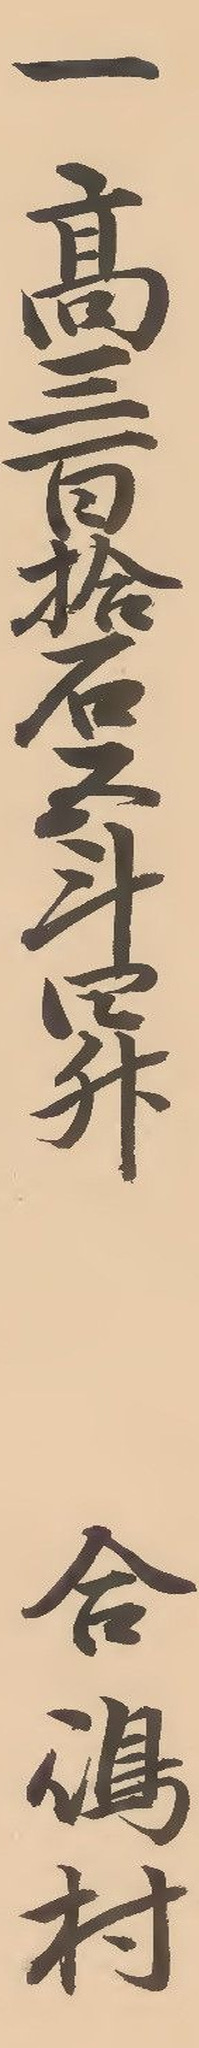一高三百拾石五斗四升合島村
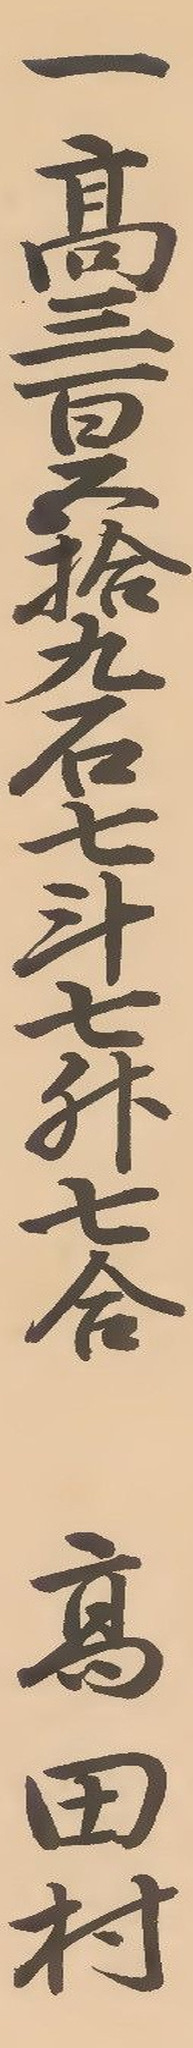一高三百五拾九石七斗七升七合高田村
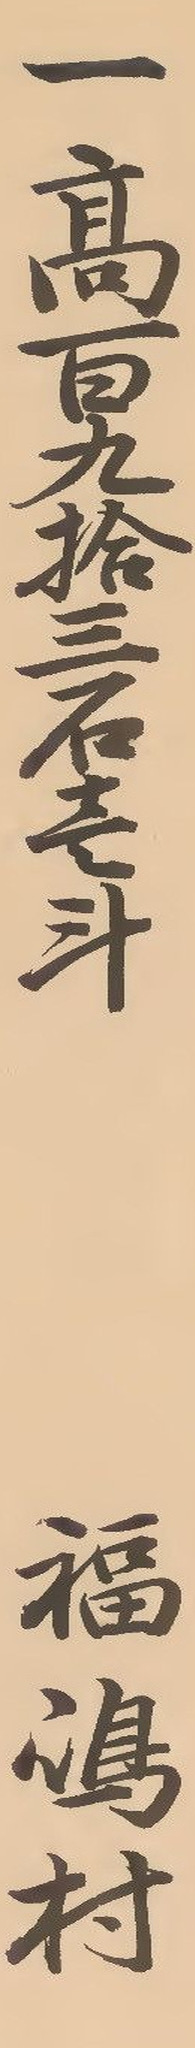一高百九拾三石壱斗福島村
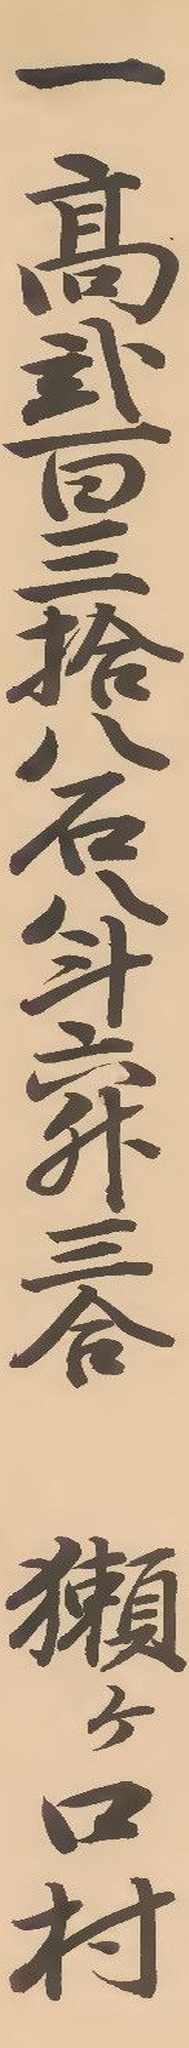一高弐百三拾八石八斗六升三合獺ヶ口村
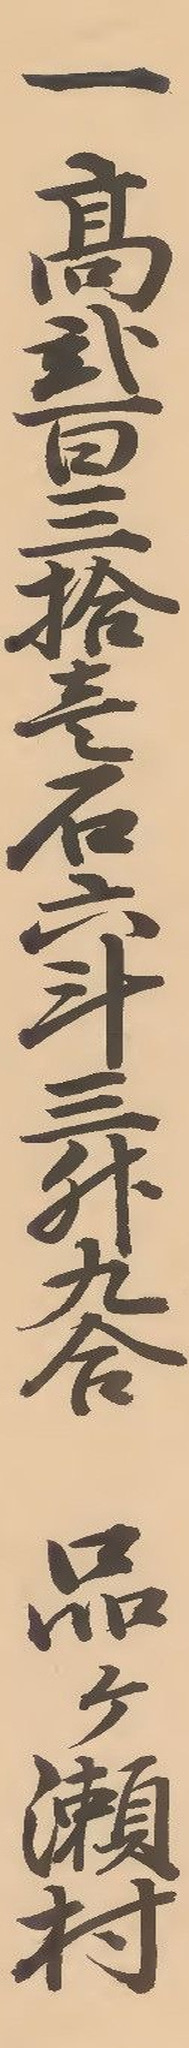一高弐百三拾壱石六斗三升九合品ヶ瀬村

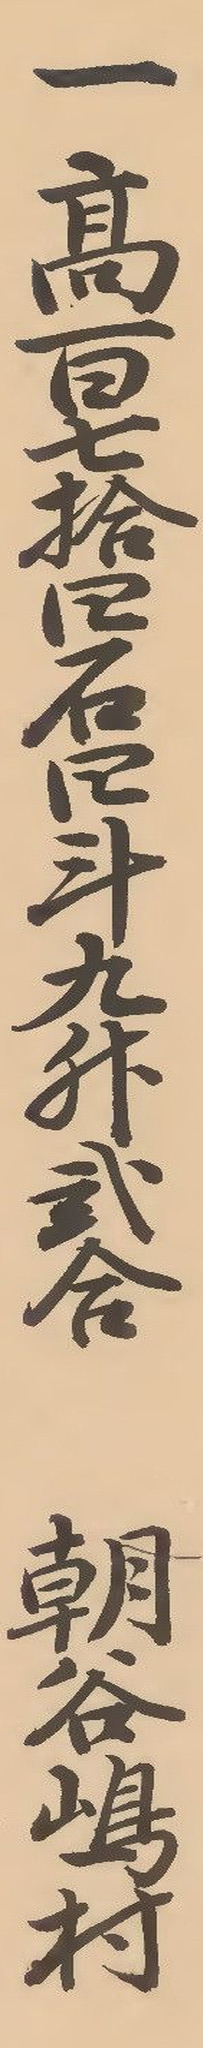一高百七拾四石四斗九升弐合朝谷島村
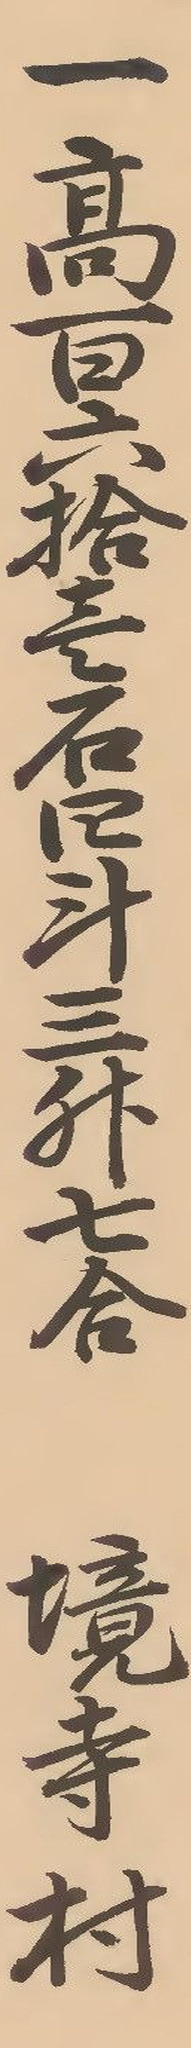一高百六拾壱石四斗三升七合境寺村
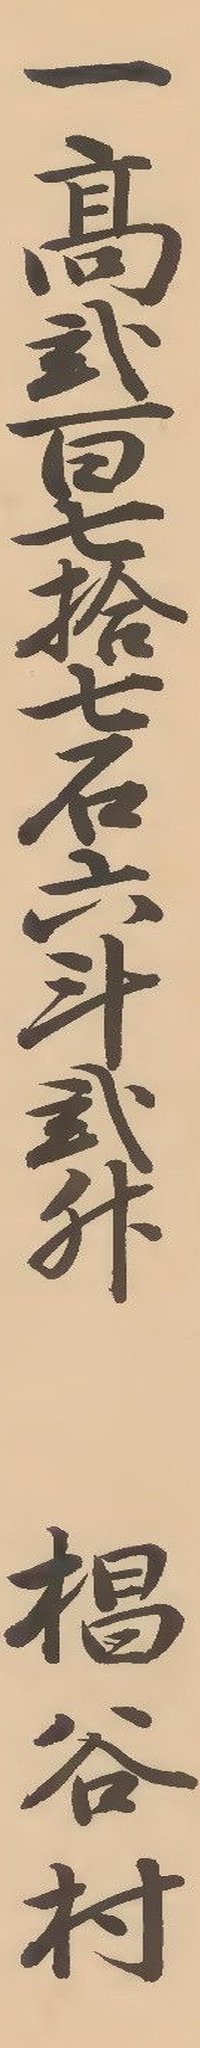一高弐百七拾七石六斗弐升杉谷村
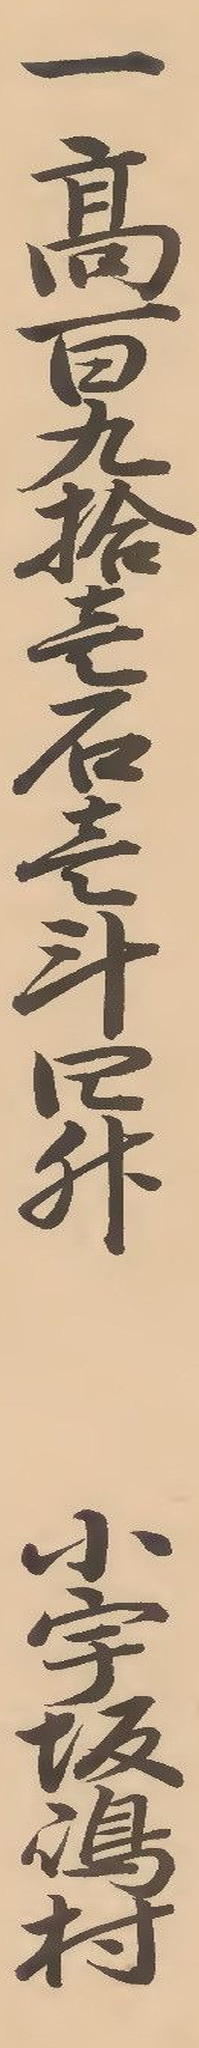一高百九拾壱石壱斗四升小宇坂島村
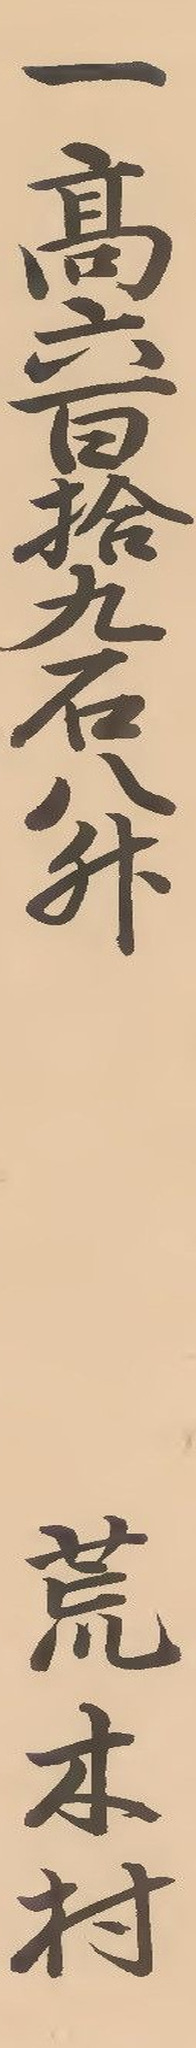一高六百拾九石八升荒木村
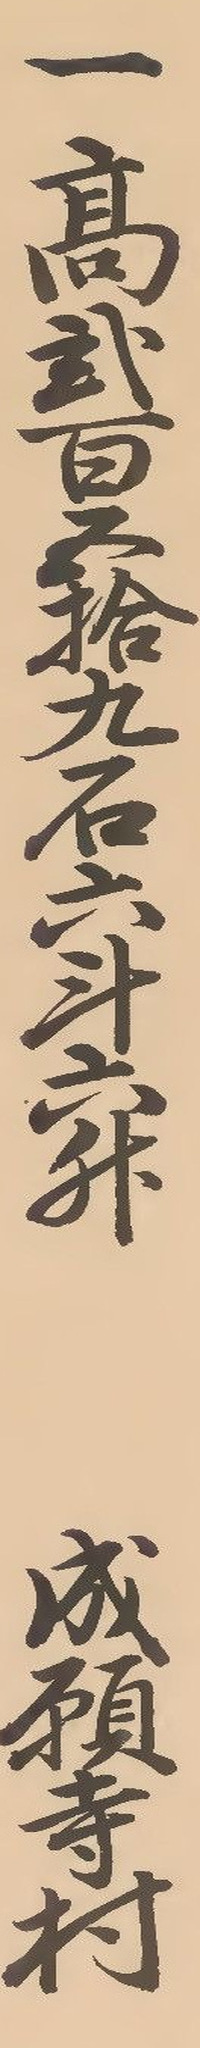一高弐百五拾九石六斗六升成願寺村
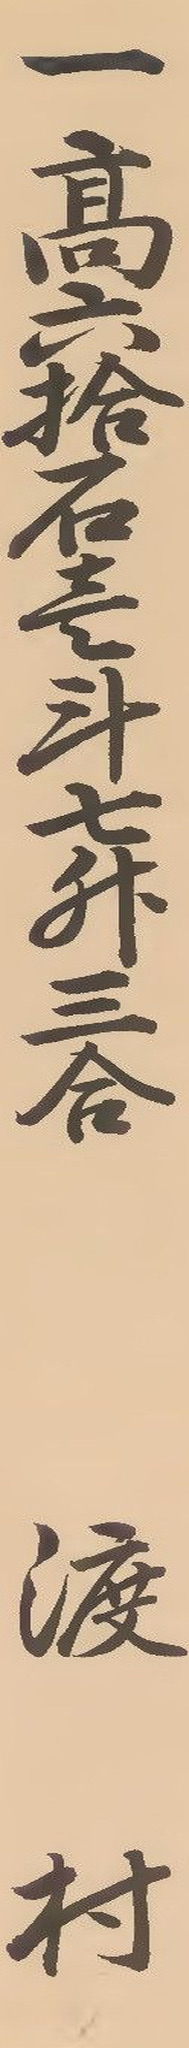一高六拾石壱斗七升三合渡村
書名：越前国郷帳
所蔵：国立公文書館 National Archives of Japan
